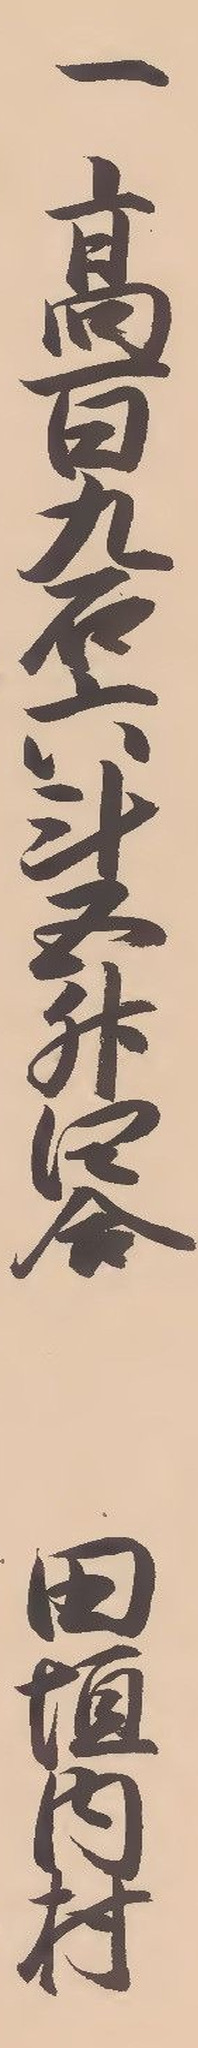一高百九石六斗五升四合田垣内村
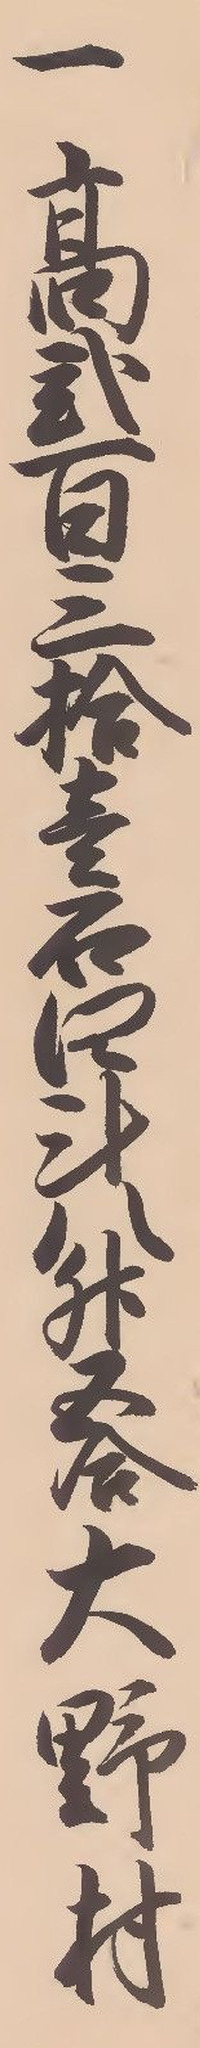一高弐百三拾壱石四斗八升五合大野村
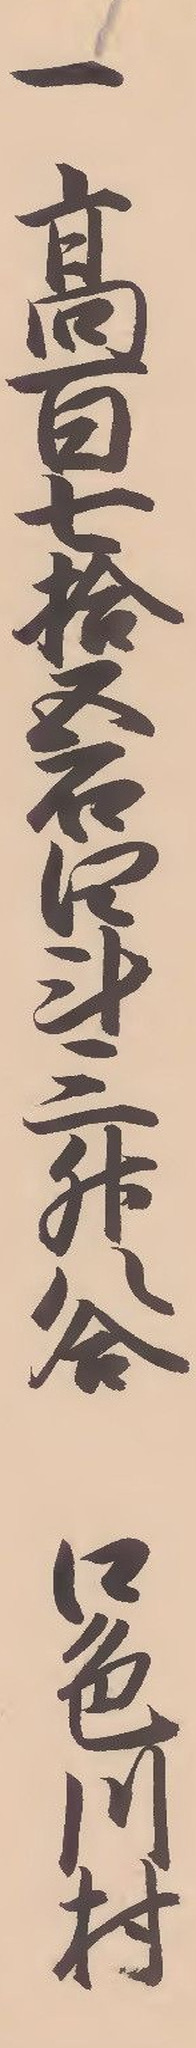一高百七拾五石四斗三升八合口色川村
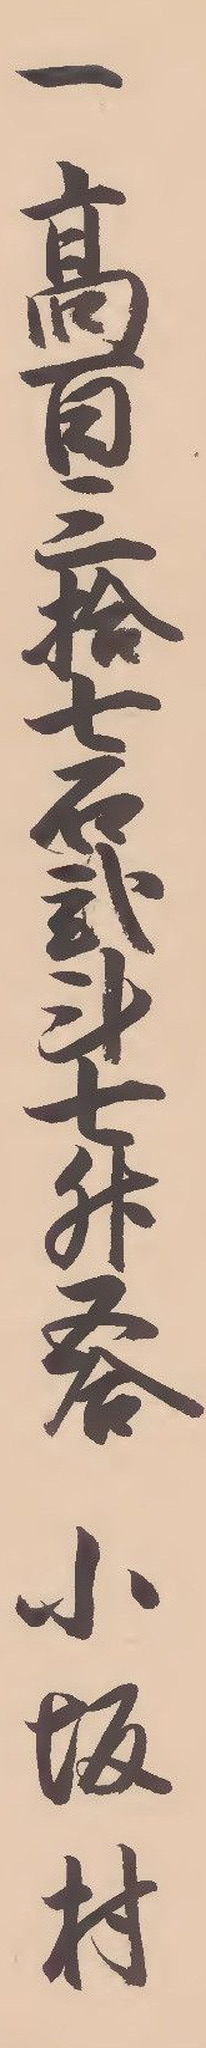一高百三拾七石弐斗七升五合小坂村
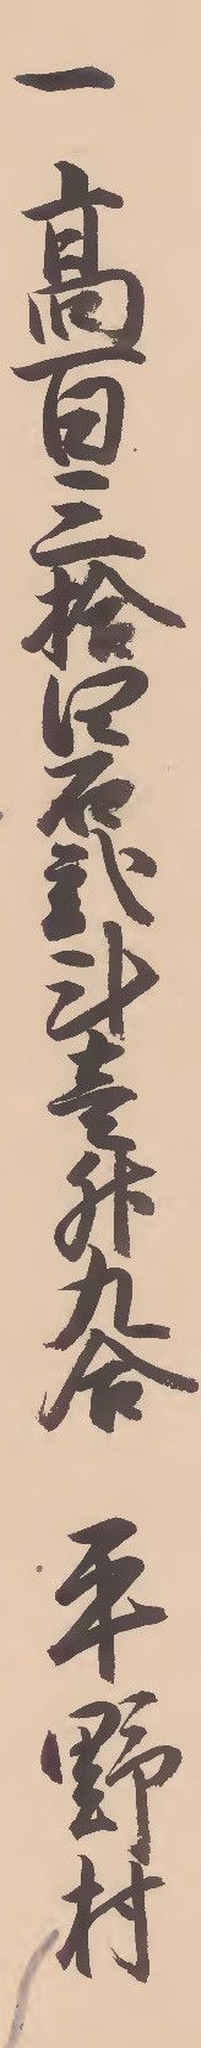一高百三拾四石弐斗壱升九合平野村

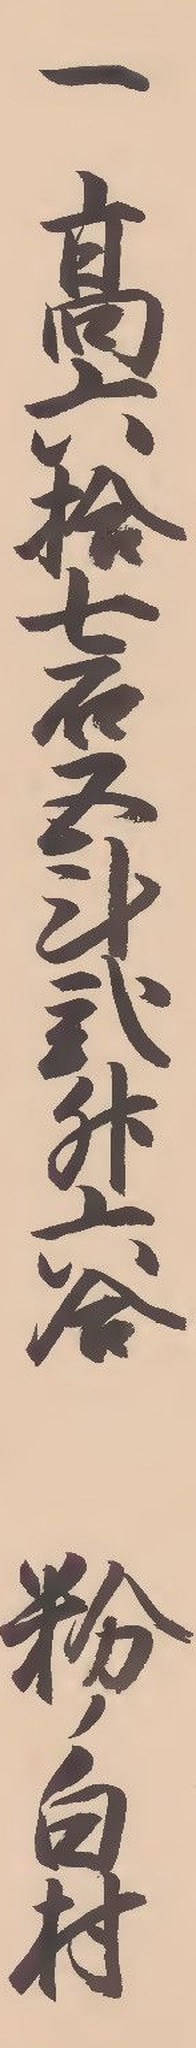一高六拾七石五斗弐升六合粉ノ白村
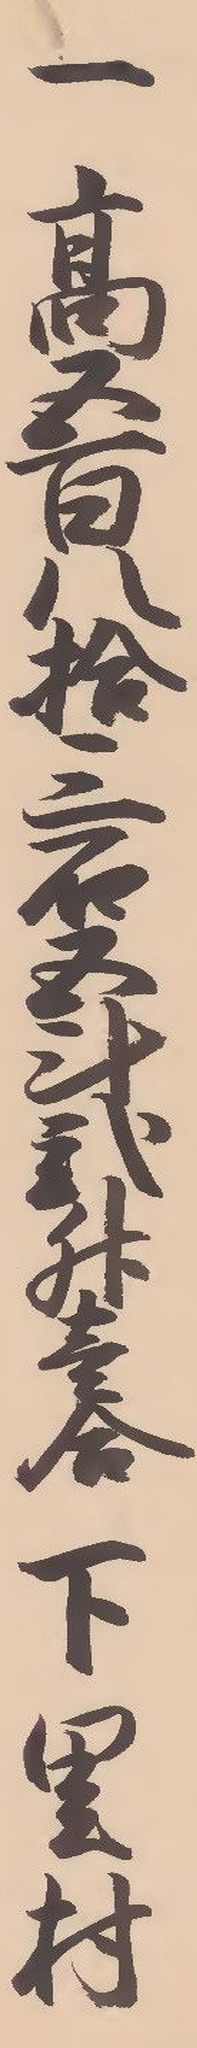一高五百八拾三石五斗弐升壱合下里村
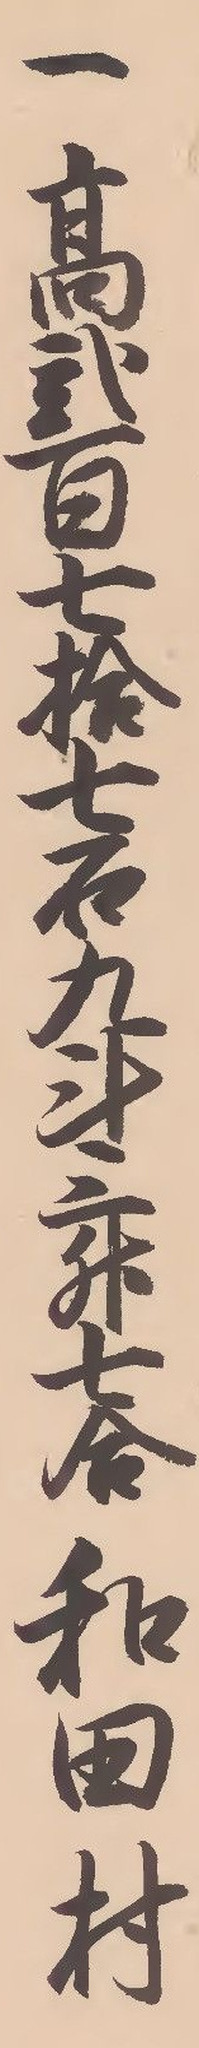一高弐百七拾七石九斗三升七合和田村
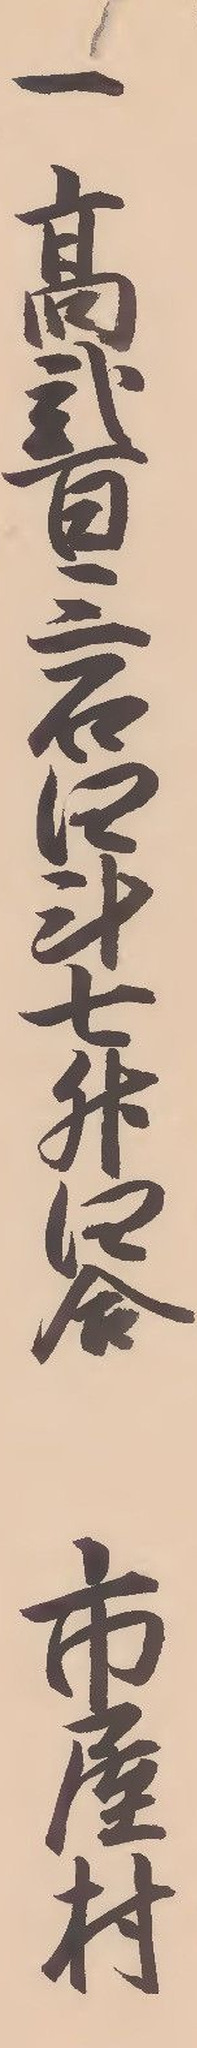一高弐百三石四斗七升四合市屋村
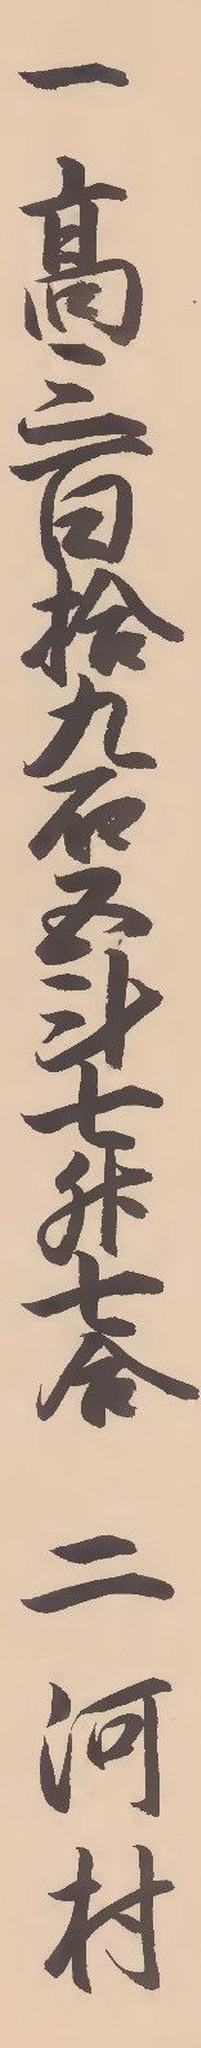一高三百拾九石五斗七升七合二河村
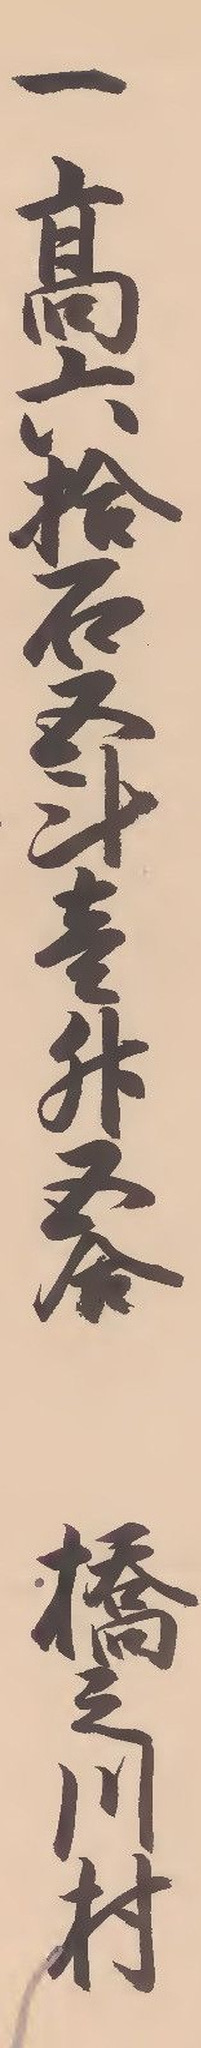一高六拾石五斗壱升五合橋之川村

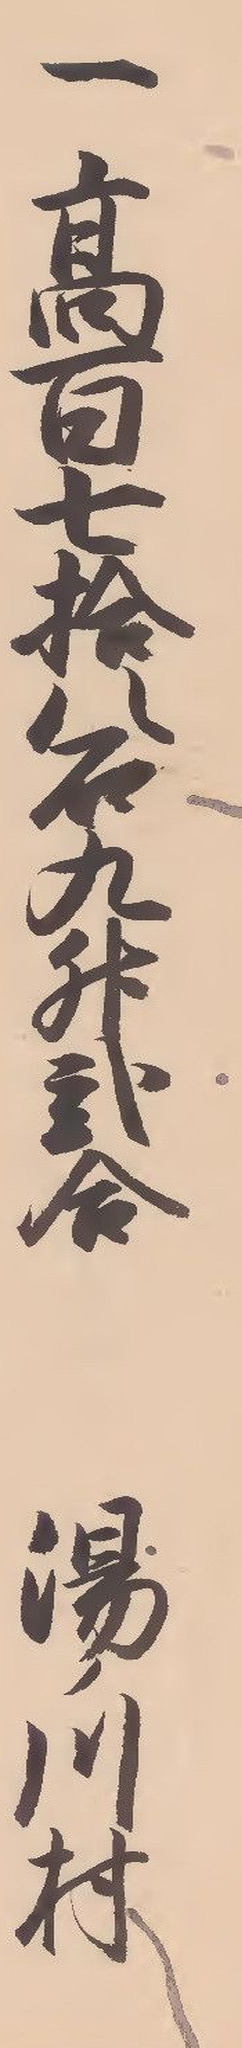一高百七拾八石九升弐合湯ノ川村
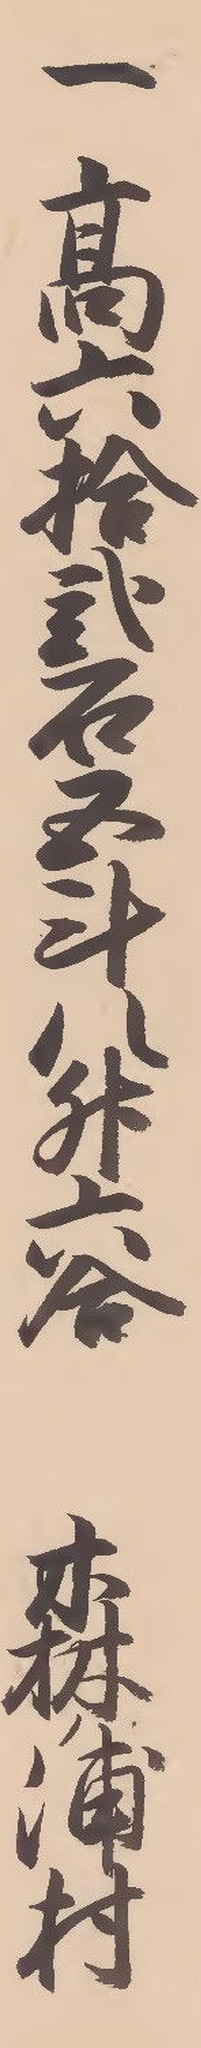一高六拾弐石五斗八升六合森ノ浦村
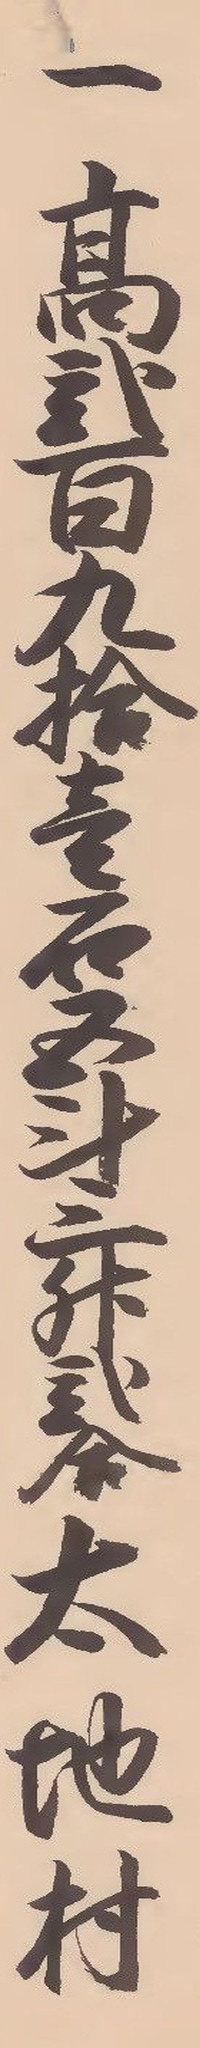一高弐百九拾壱石五斗三升弐合太地村
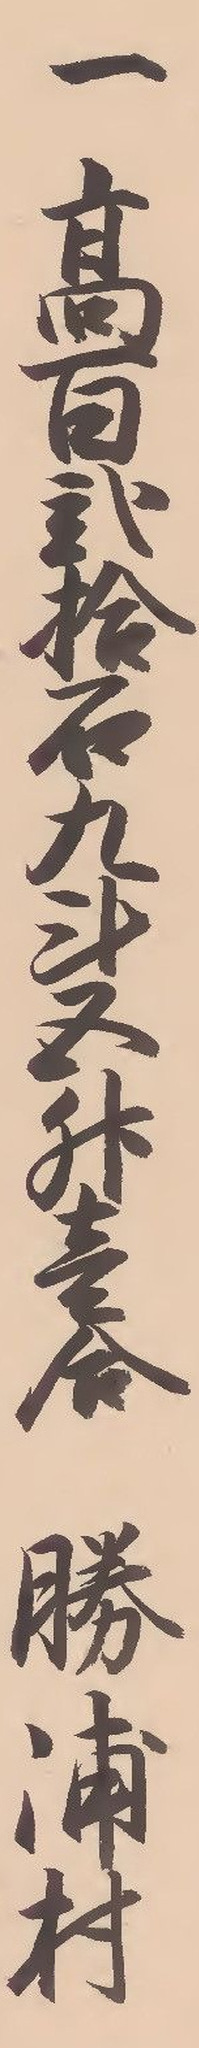一高百弐拾石九斗五升壱合勝浦村
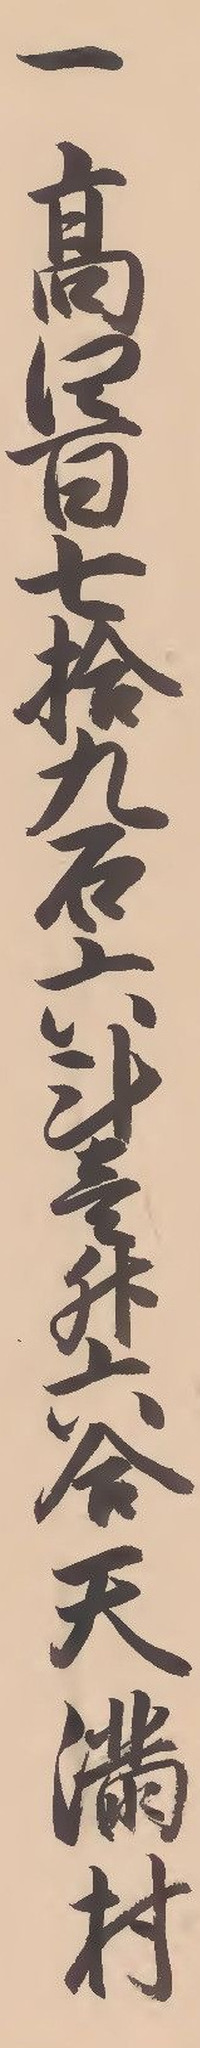一高四百七拾九石六斗壱升六合天満村
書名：紀伊国郷帳
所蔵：国立公文書館 National Archives of Japan
